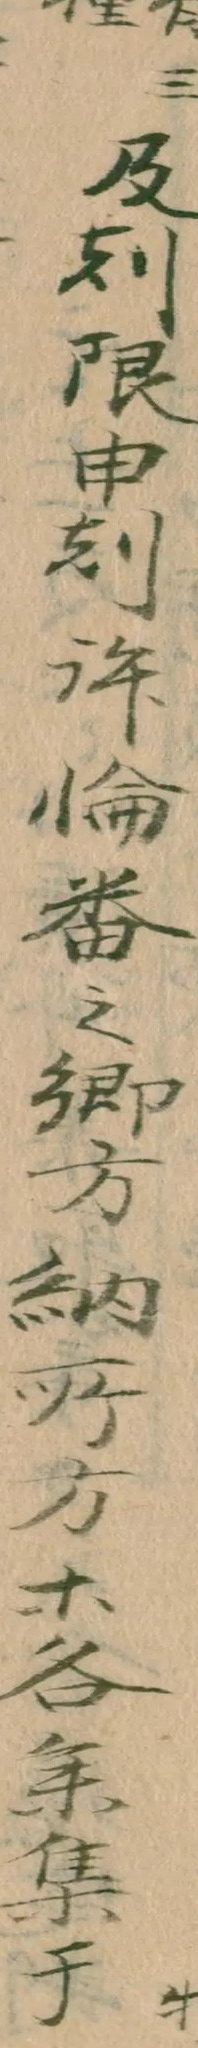肴三種及刻限申刻許輪番之郷方納所方等各参集于
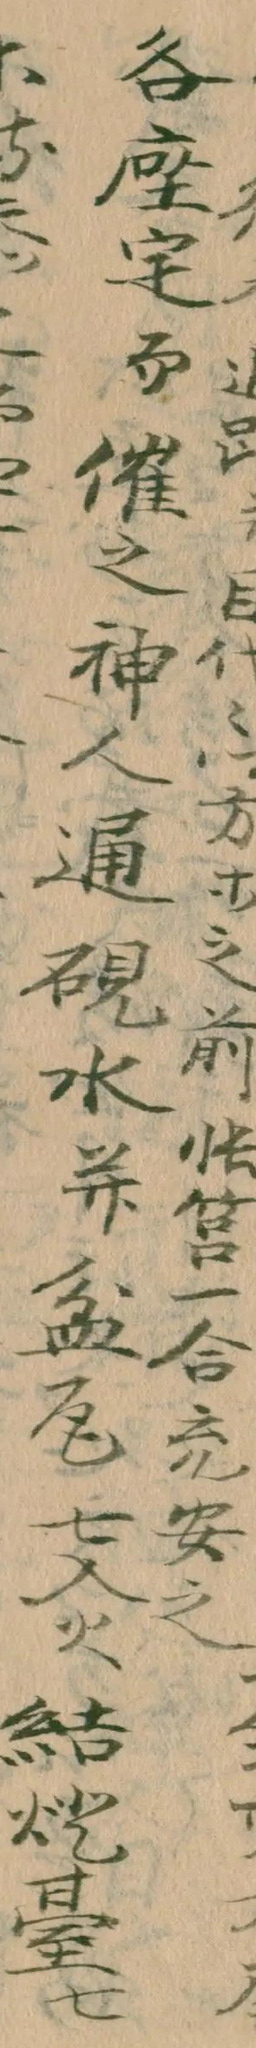各座定而催之神人通硯水并盆瓦七入火結燈台七
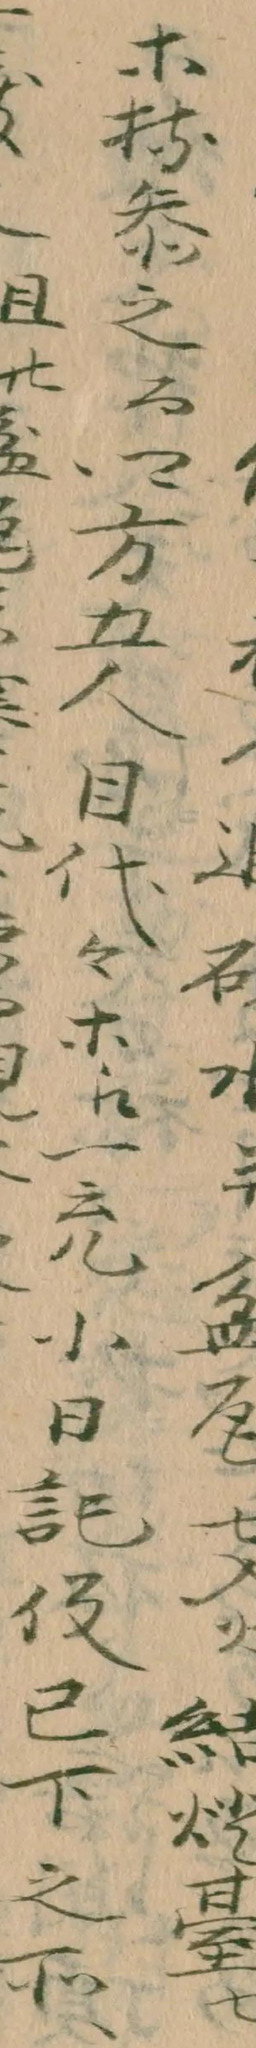等持参之而郷方五人目代々等え一充小日記役已下之所へ
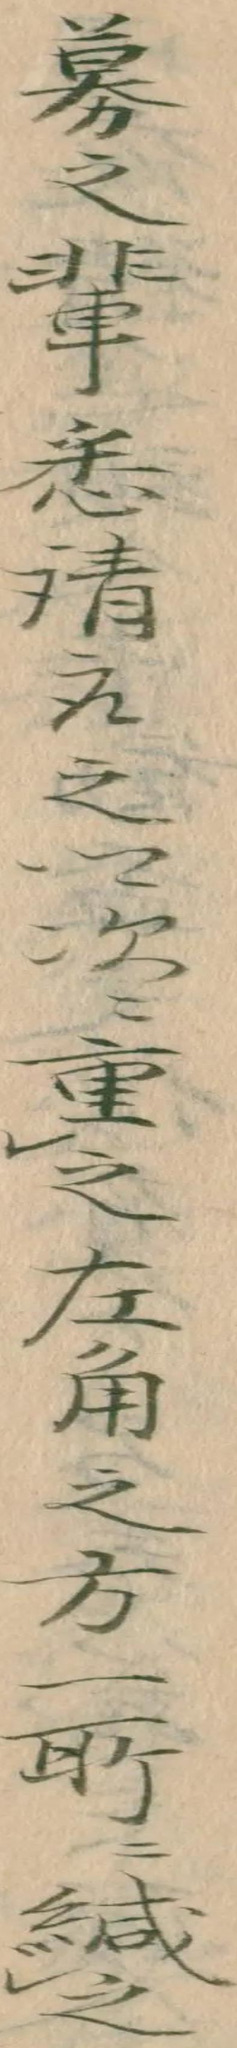募之輩悉請取之郷次ニ重之左角之方一所ニ緘之
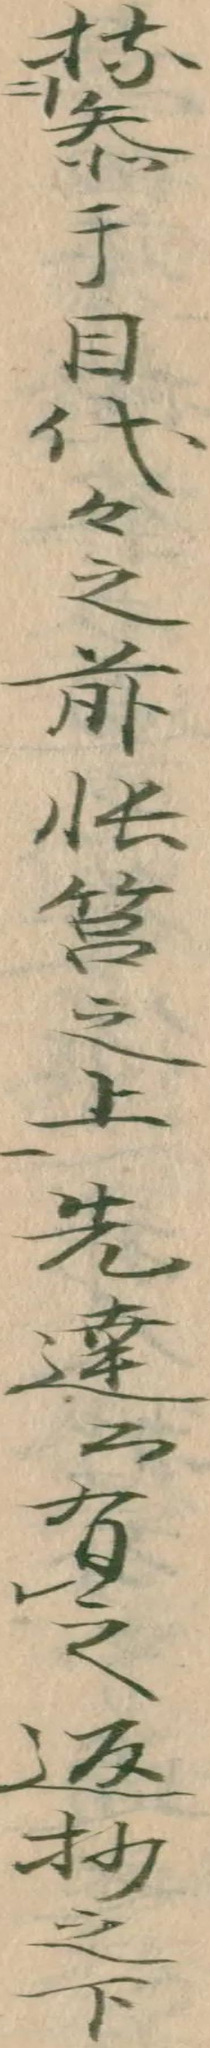持-参于目代々之前帳筥之上先達而有之返抄之下
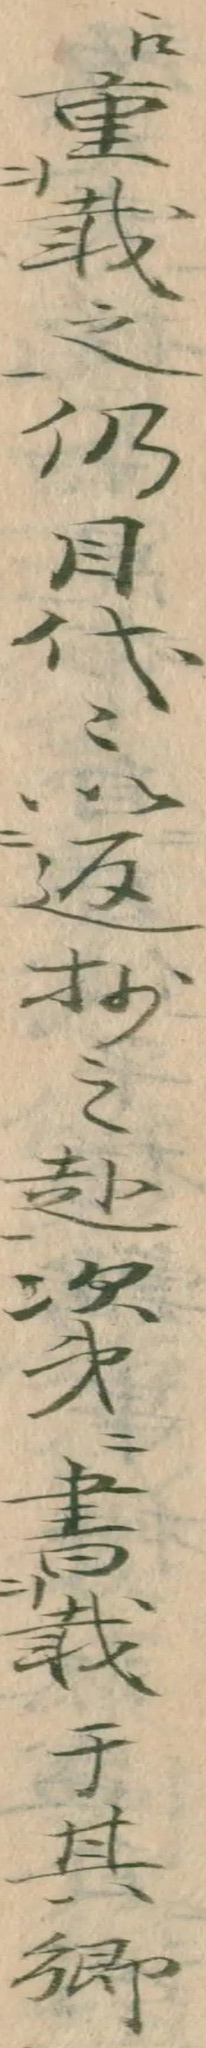え重-載之仍目代々以返抄之赴次第ニ書-載于其郷
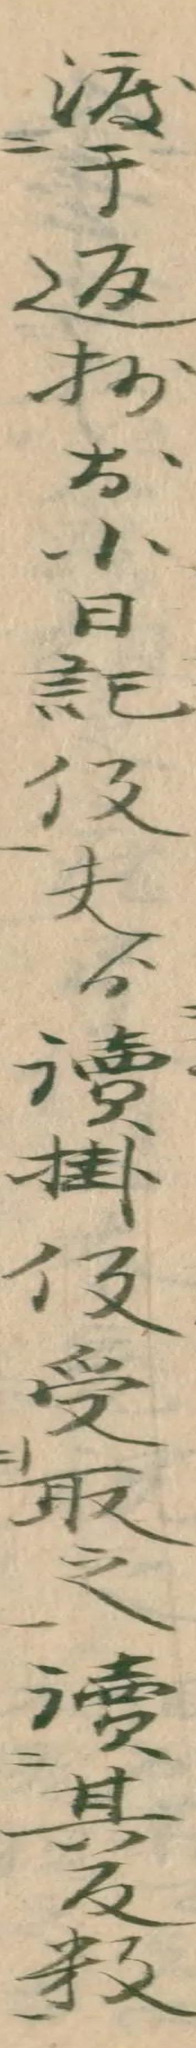渡于返抄於小日記役夫ゟ読掛役受-取之読其反数

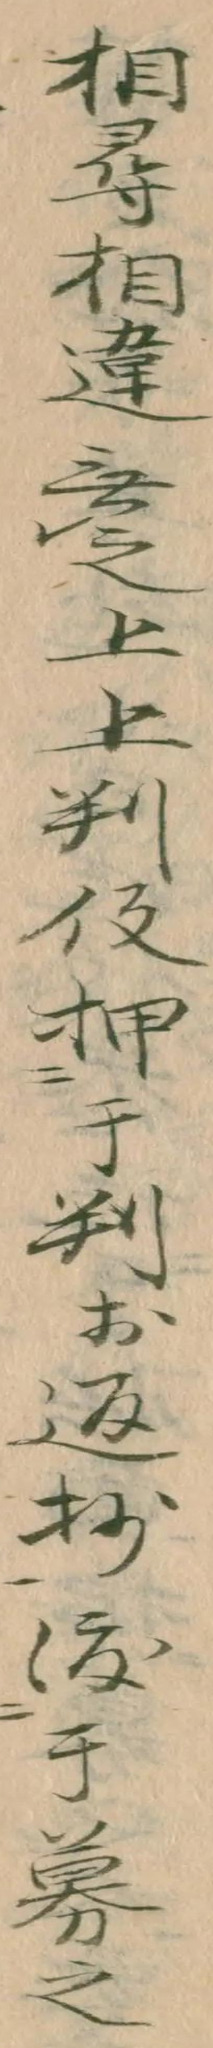相尋相違無之上判役押于判於返抄渡于募之
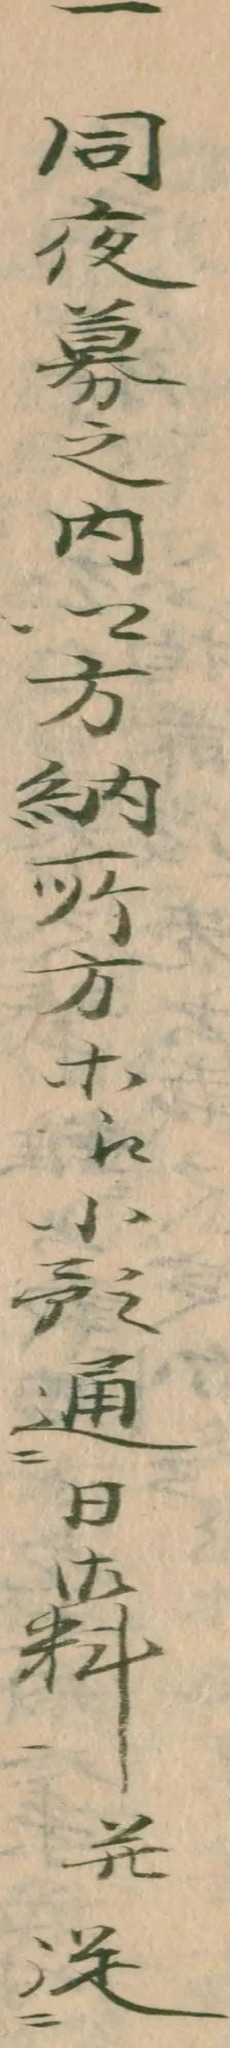一同夜募之内郷方納所方等え小預通日御料并従
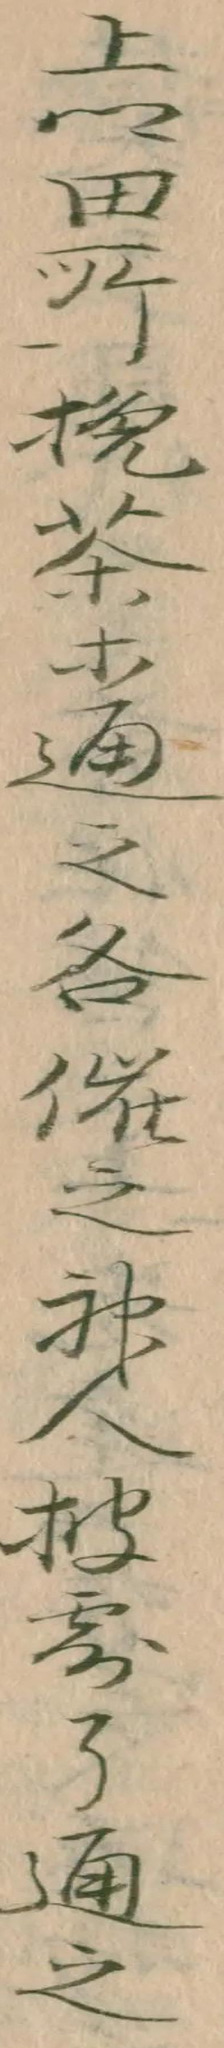上郷田所挽茶等通之各催之神人披露了通之
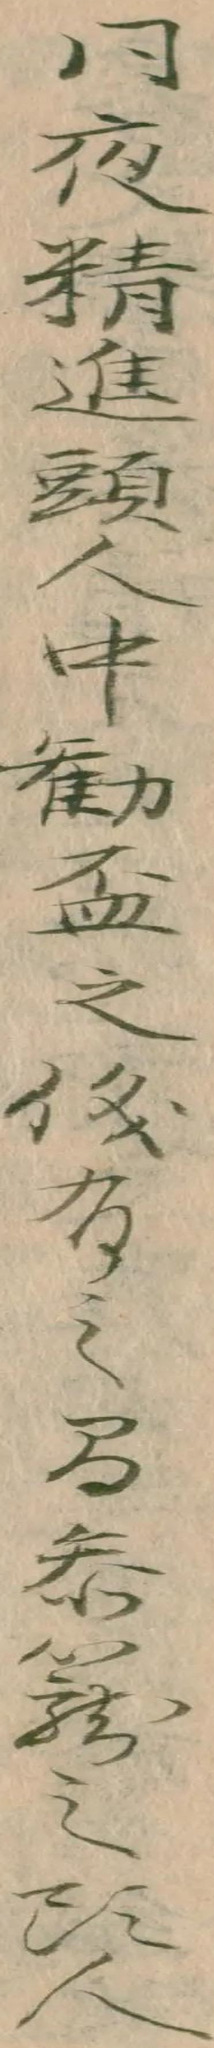一同夜精進頭人中勧盃之儀有之間参籠之頭人
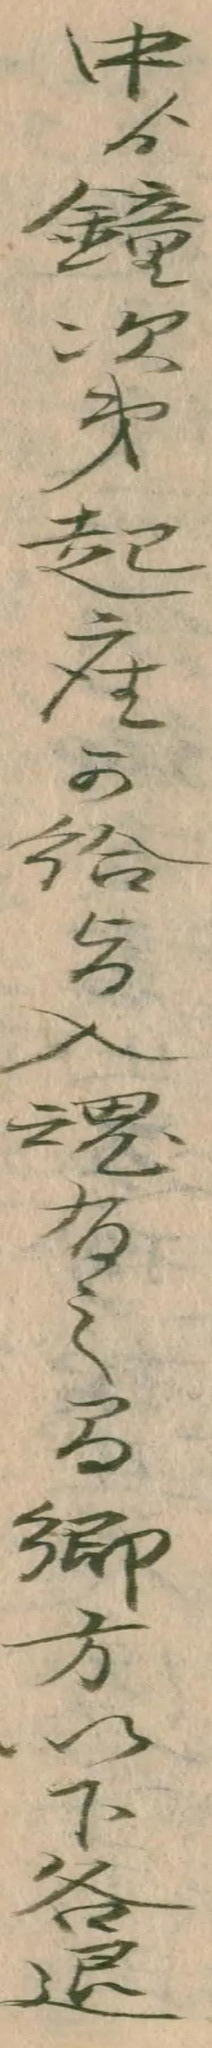中ゟ鐘次第起座可給旨入魂有之間郷方以下各退
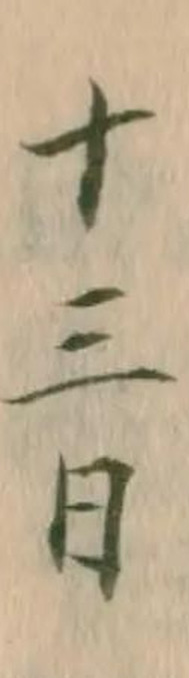十三日
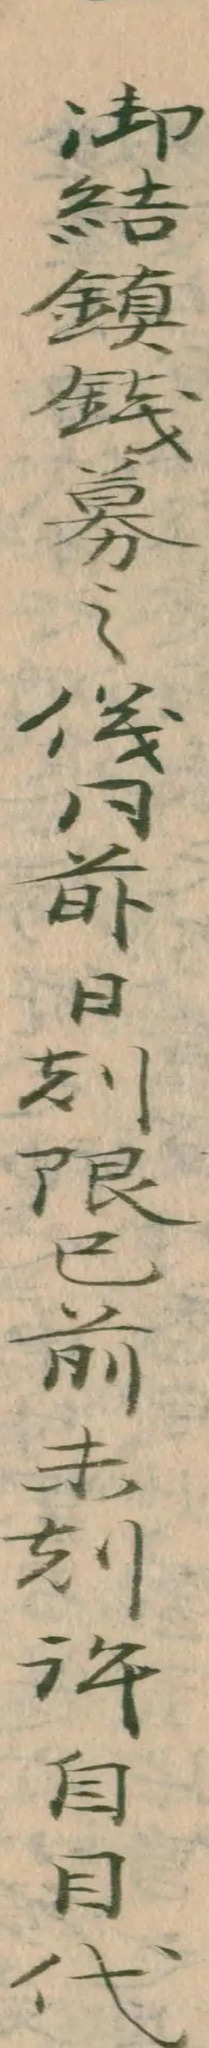一御結鎮銭募之儀同前日刻限已前未刻許自目代
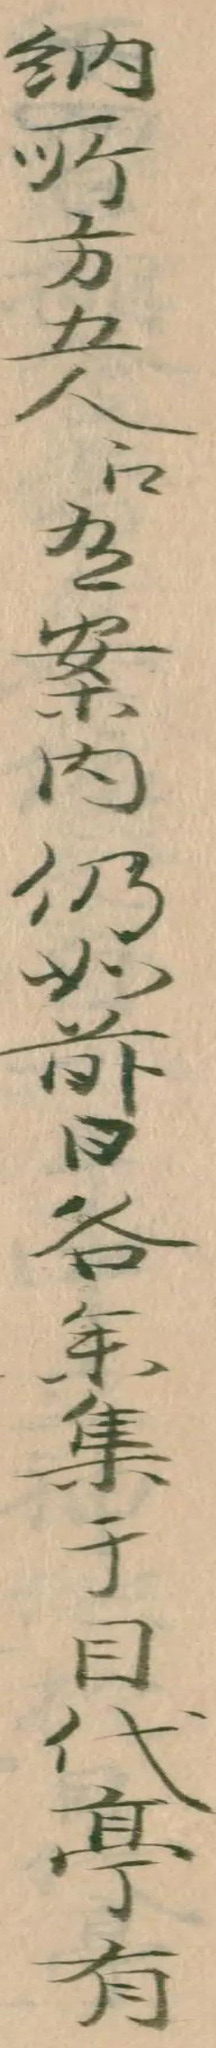納所方五人え有案内仍如前日各参集于目代亭有
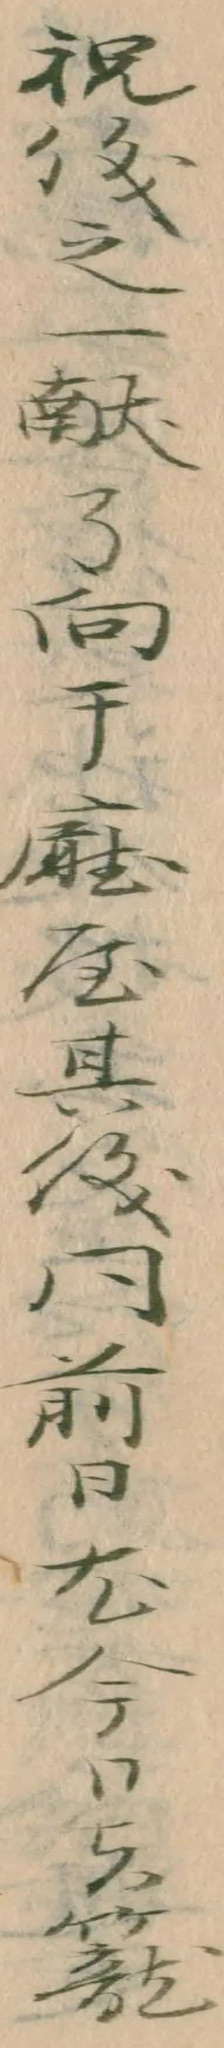祝儀之一献了向于庁屋其儀同前日尤今日は籠
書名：賀茂社記録. 第26冊
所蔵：国立国会図書館 National Diet Library, JAPAN
